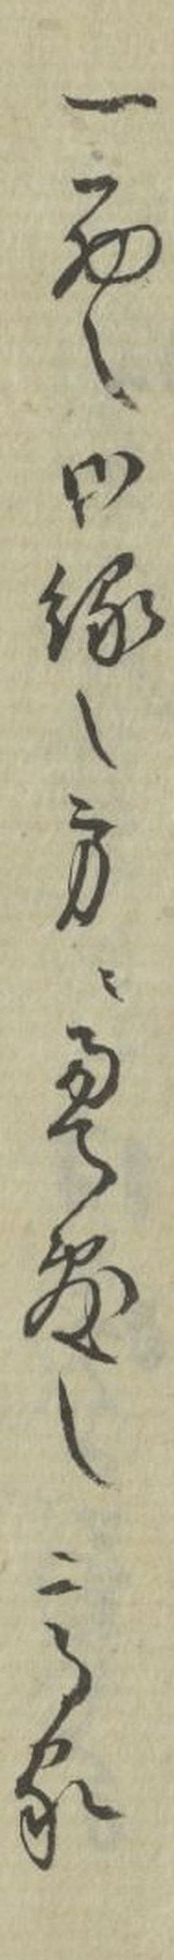一西之御縁之方に畳敷之高家
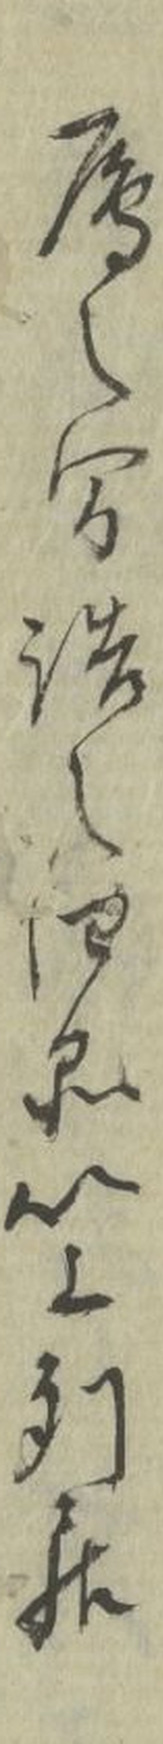雁之間詰之四品以上列居

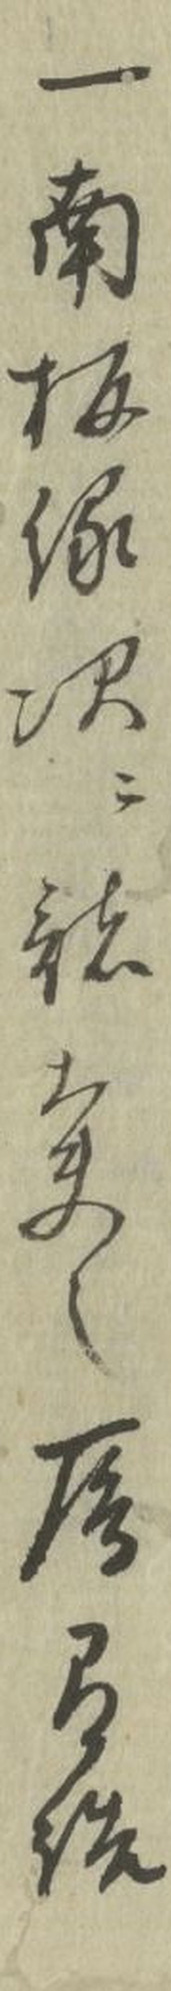一南板縁次に諸大夫之雁間詰
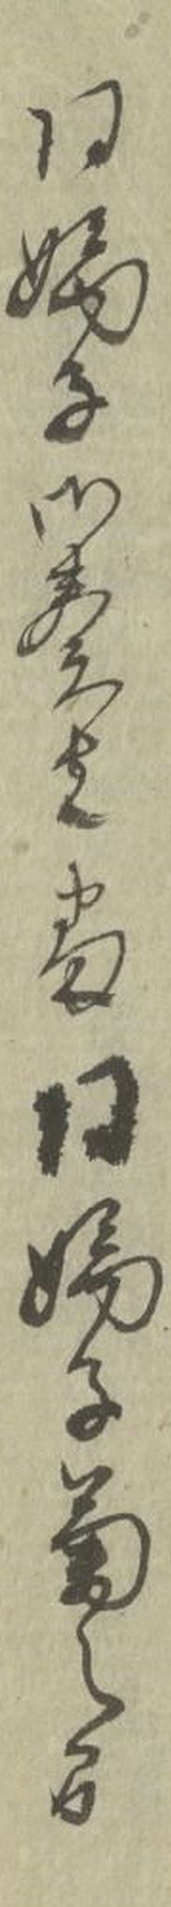同嫡子御奏者番同嫡子菊之間
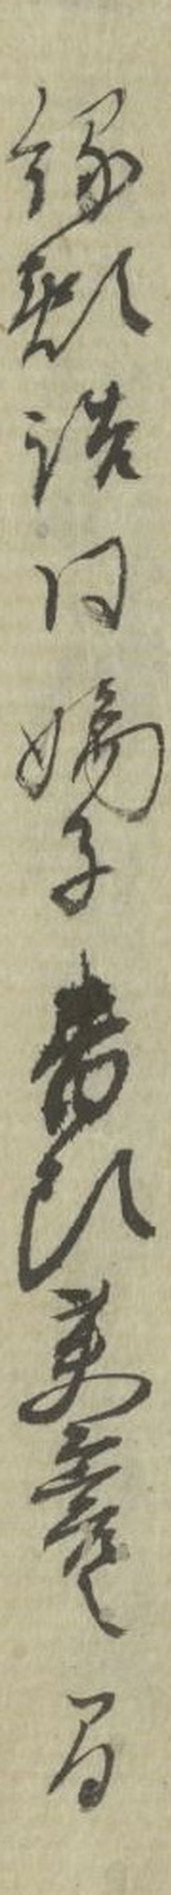縁頬詰同嫡子番頭芙蓉之間
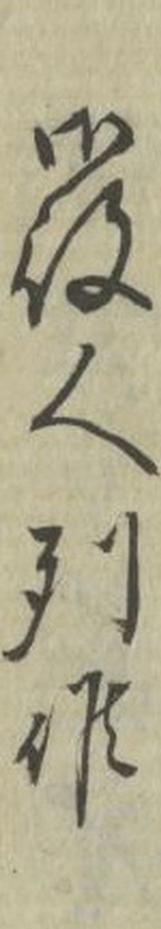御役人列候
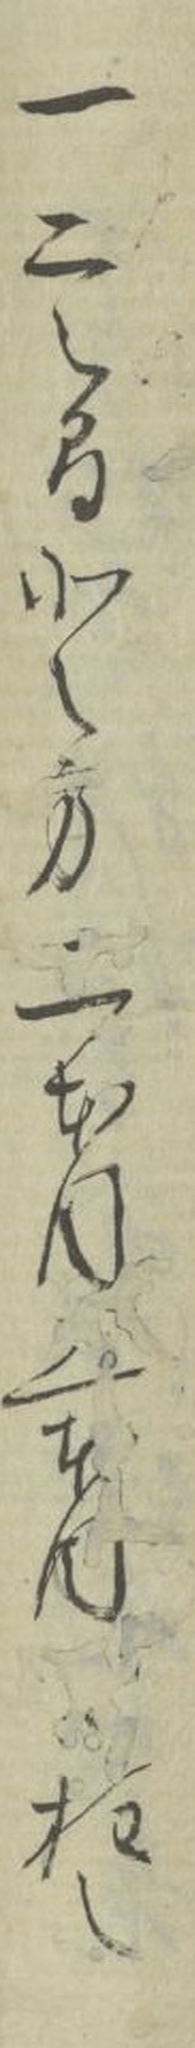一二之間北之方二本目三本目柱之
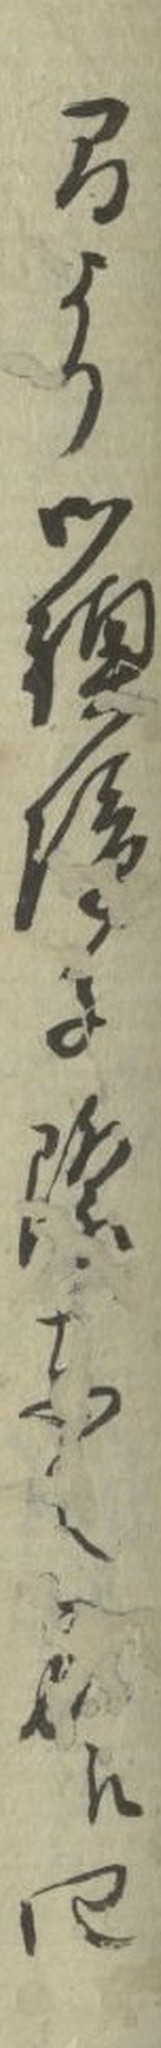間より御襖障子際東之方え四
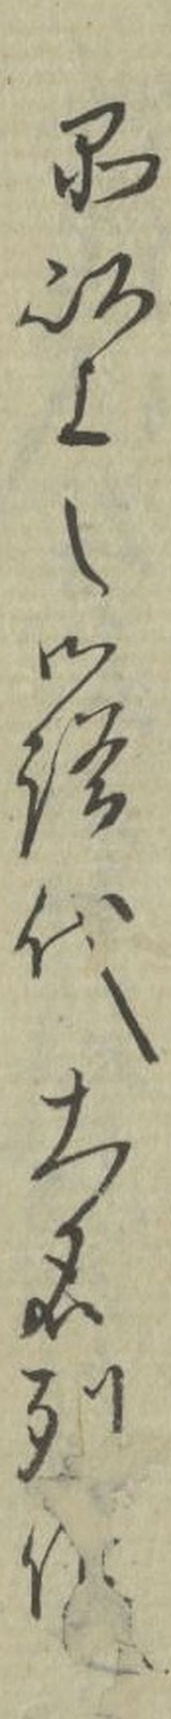品以上之御譜代大名列候
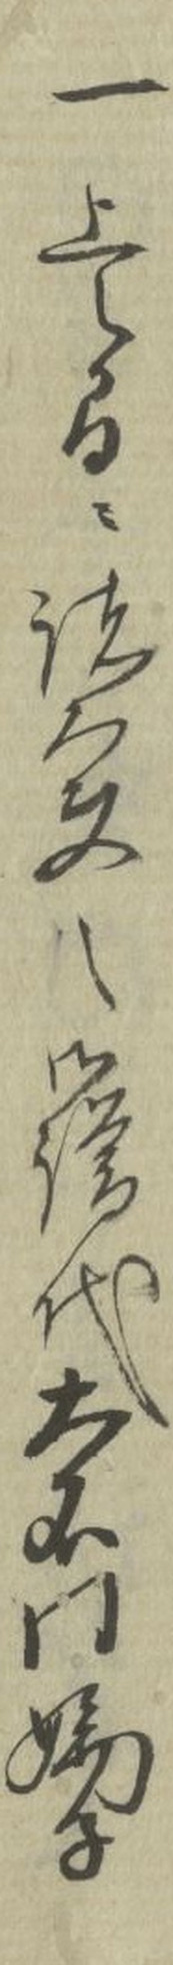一上之間に諸大夫之御譜代大名同嫡子
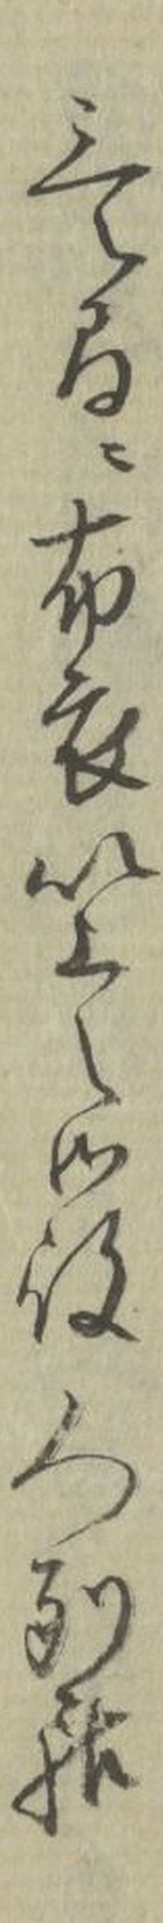三之間に布衣以上之御役人列居
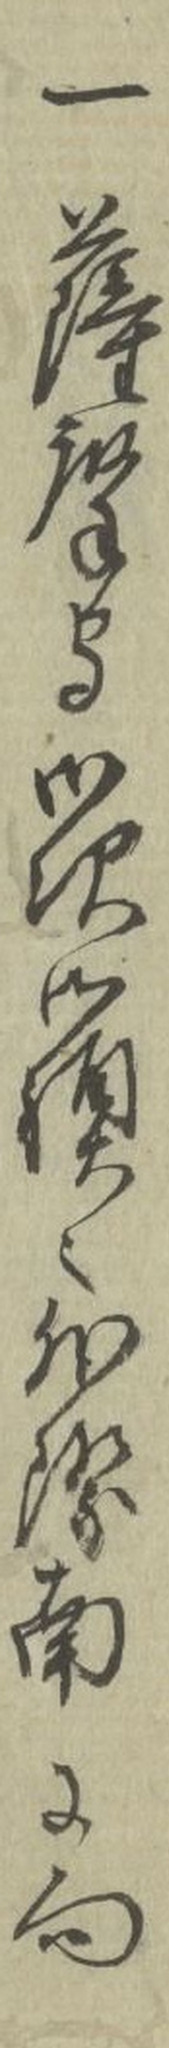一薩摩守御次御襖之外際南に向

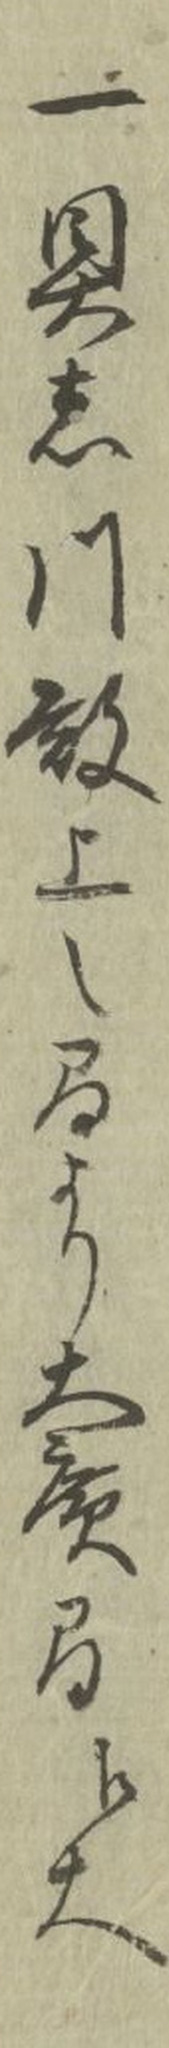一具志川殿上之間より大広間え大
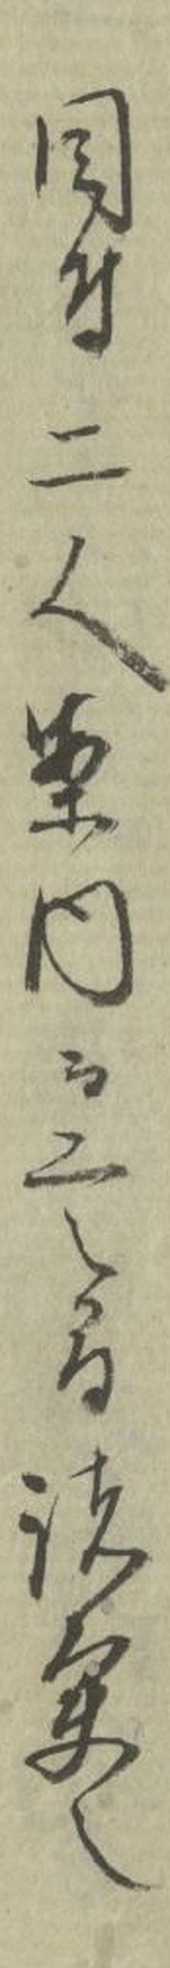目付二人案内而二之間諸大夫之
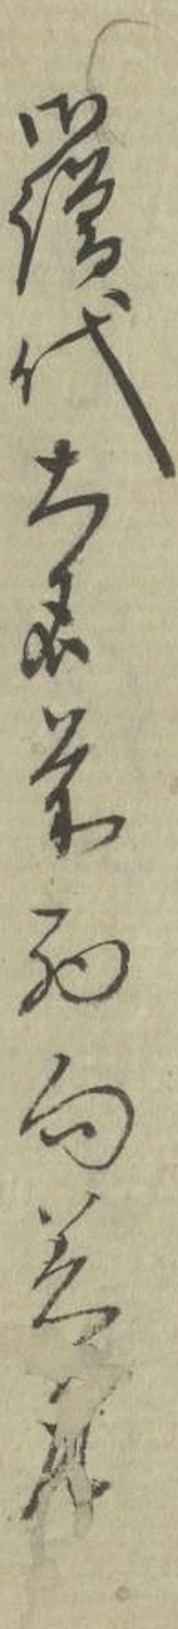御譜代大名前西向着座
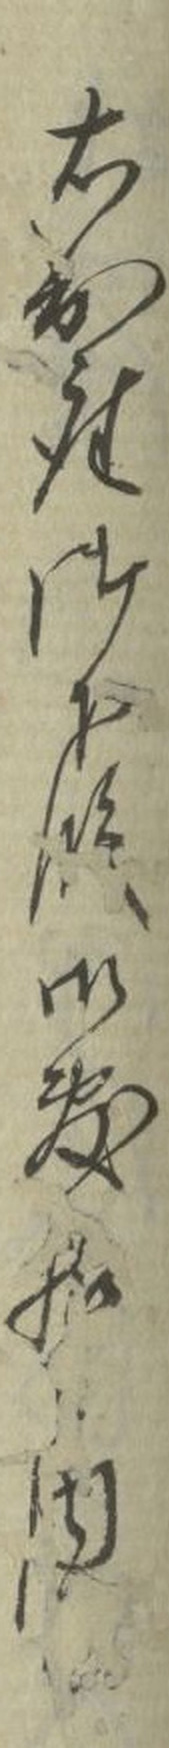右出座御下段御敷居内
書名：琉球来朝記 自八至十四終
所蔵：University of the Ryukyus Library
